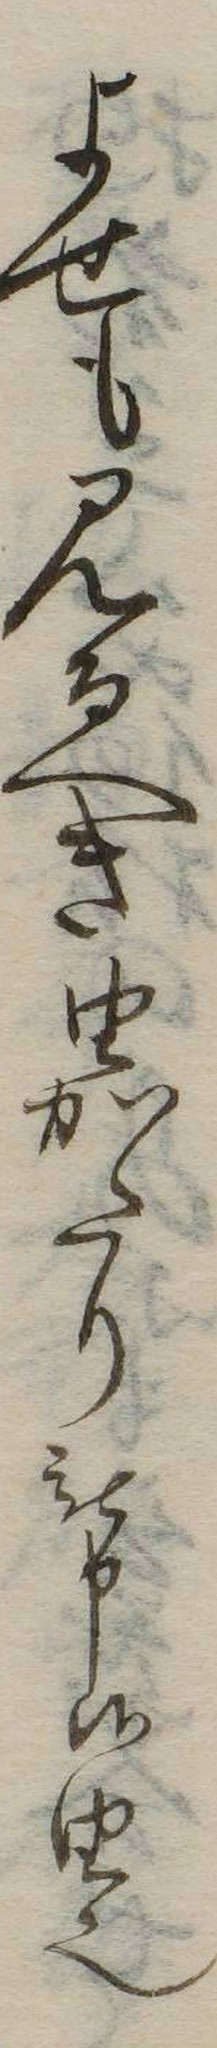よせも見るへき由かたり被申候由也
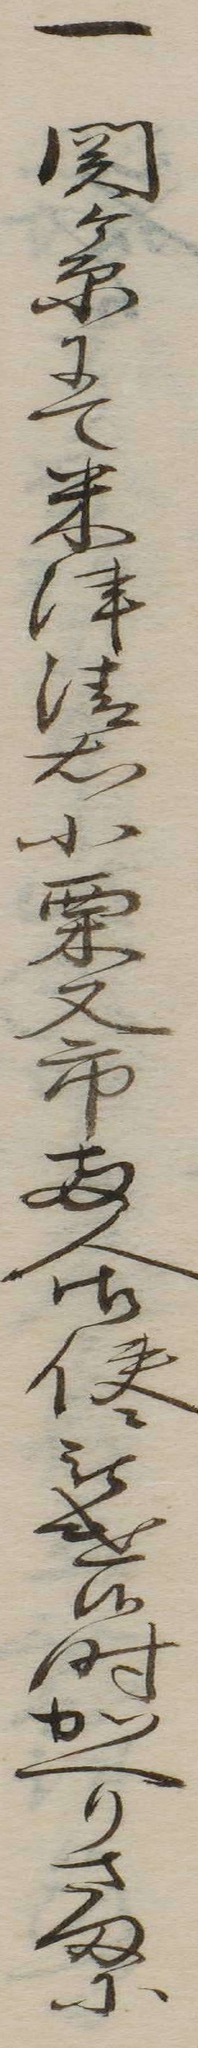一関ヶ原にて米津清右小栗又市両人御使ニ被遣候時かへりさまに
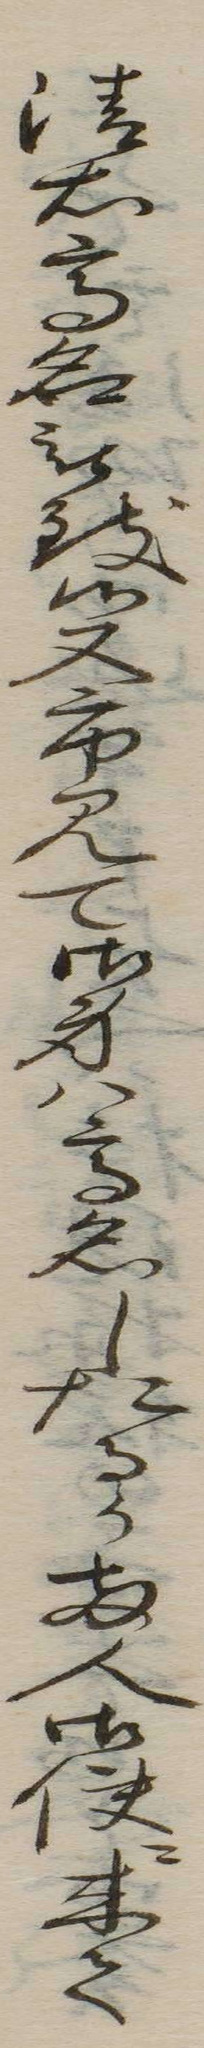清右高名被致候又市見て御身は高名したるか両人御使ニ来て
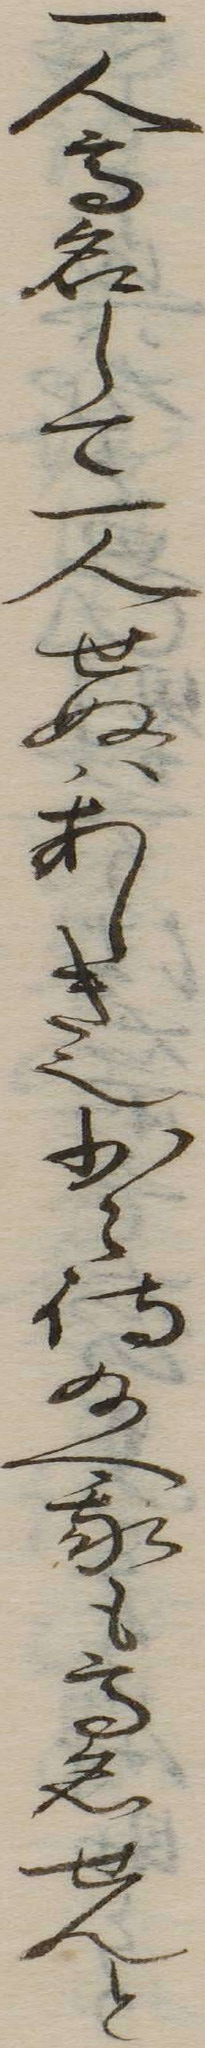一人高名して一人せぬはあしき也少々待給へ我も高名せんと
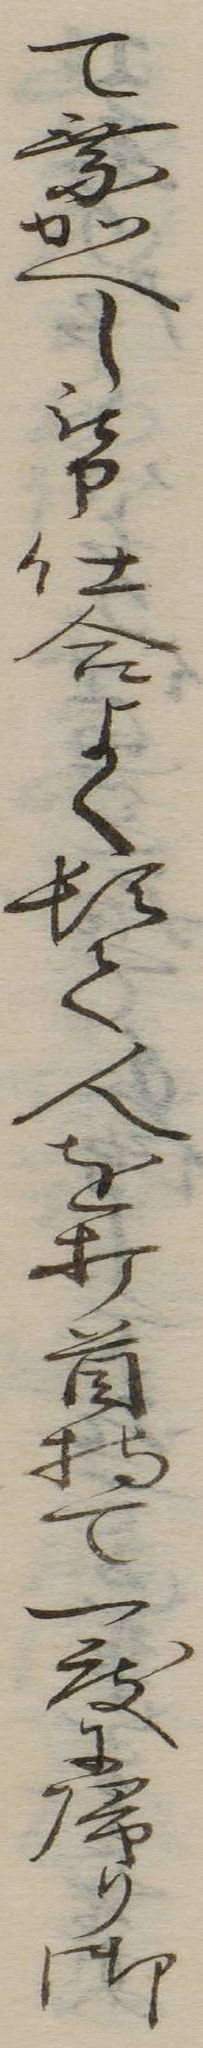て乗かへし被申仕合よく頓て人を打首持て一度に帰り御
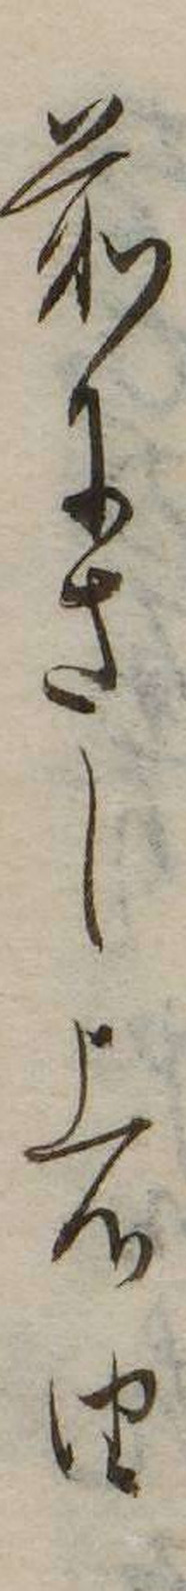前にさし上候由
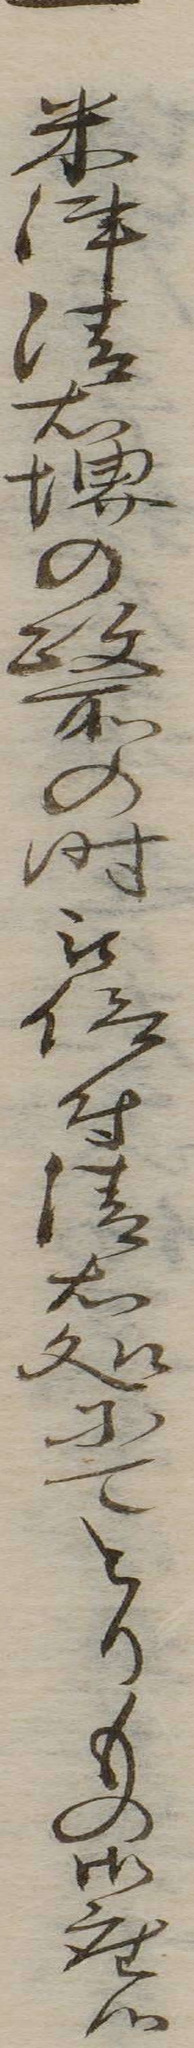一米津清右堺の政所の時被仰付清右処にてとりもの御座候
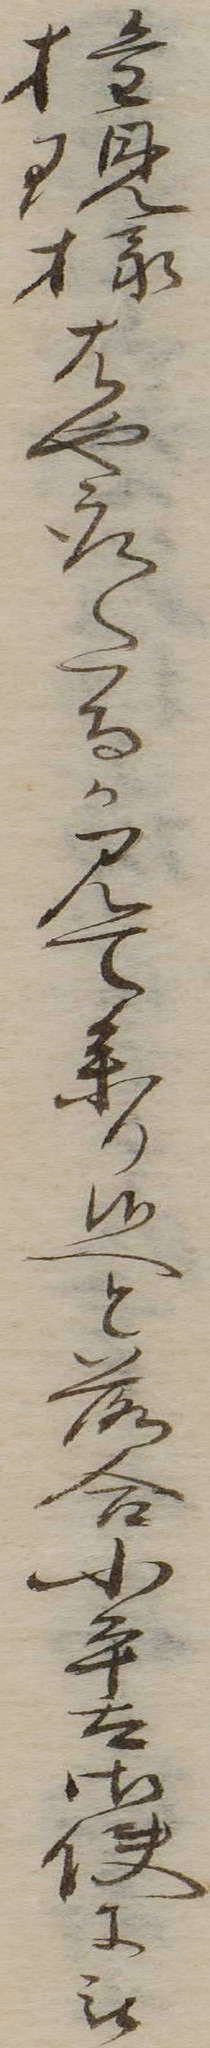権現様はや取たるか見て参り候へと落合小平太御使に被

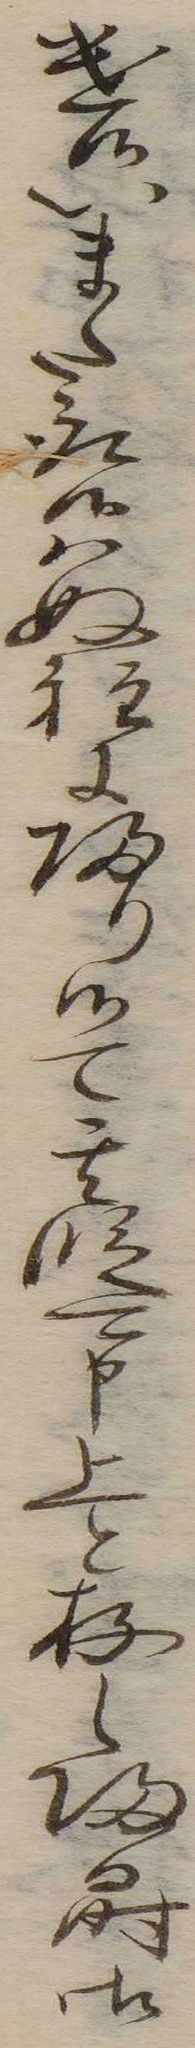遣候いまた取候はぬ程に帰り候て其段可申上と存し帰る時御
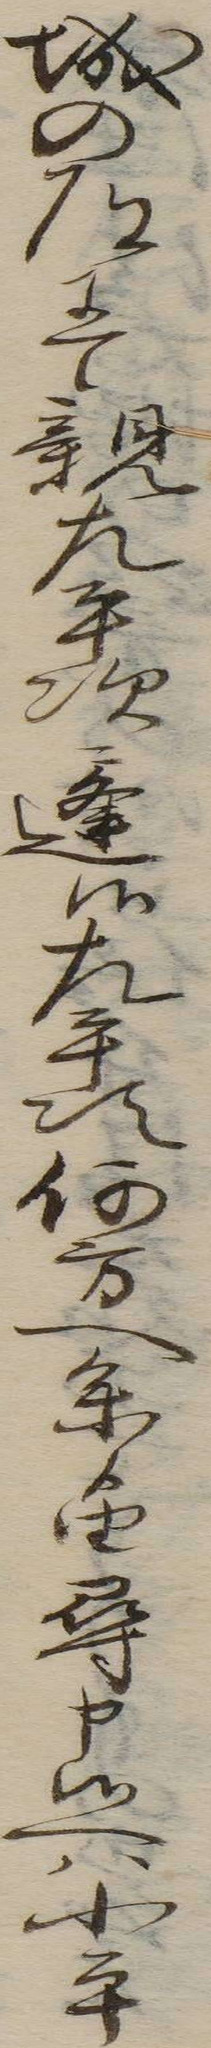城の道にて親左平次ニ逢候左平次何方へ参候由尋申候へは小平
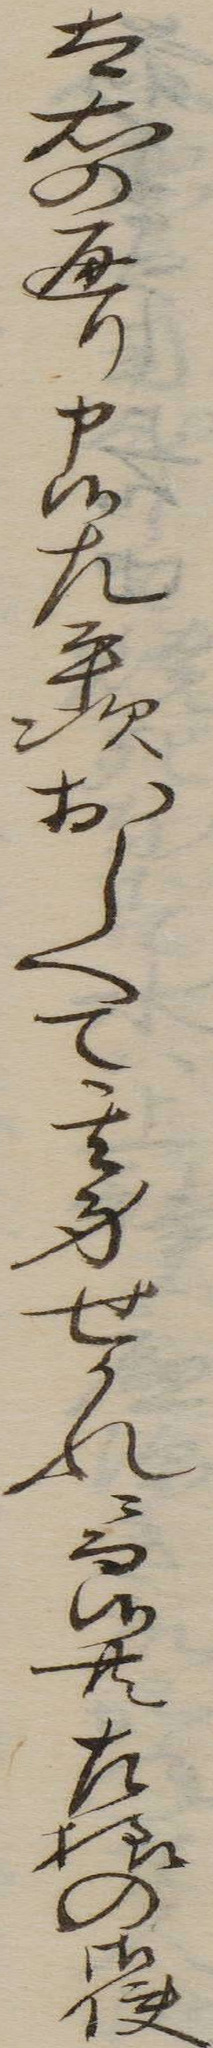太右の通り申候左平次おしくて其身せかれニ而候共左様の御使
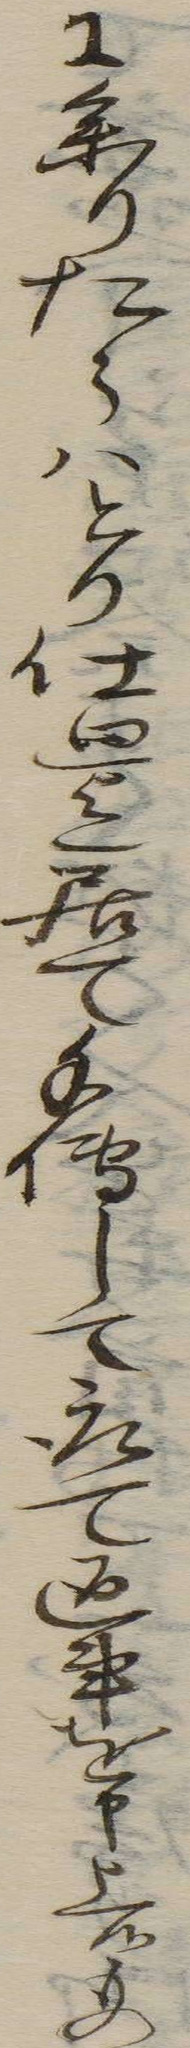に参りたらはとり仕廻迄居て手伝して取て返事を申上候もの
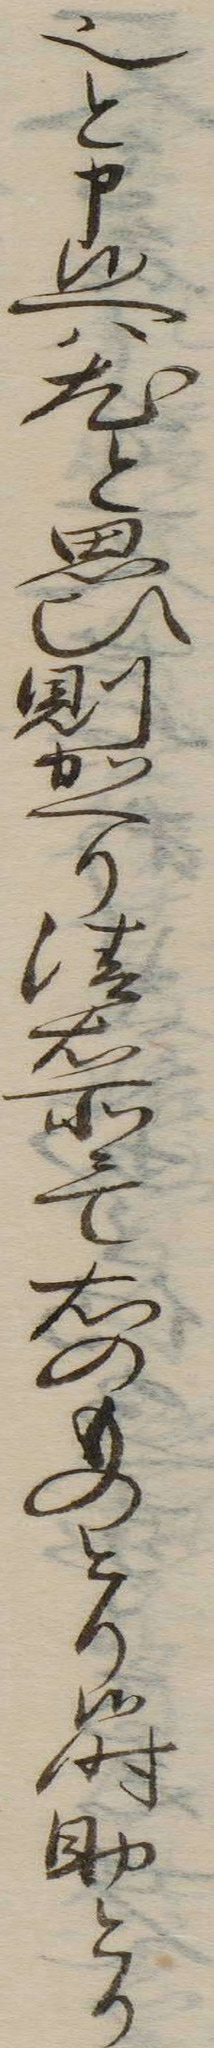也と申候へは尤と思ひ則かへり清右所ニて右のものとり候時助とり
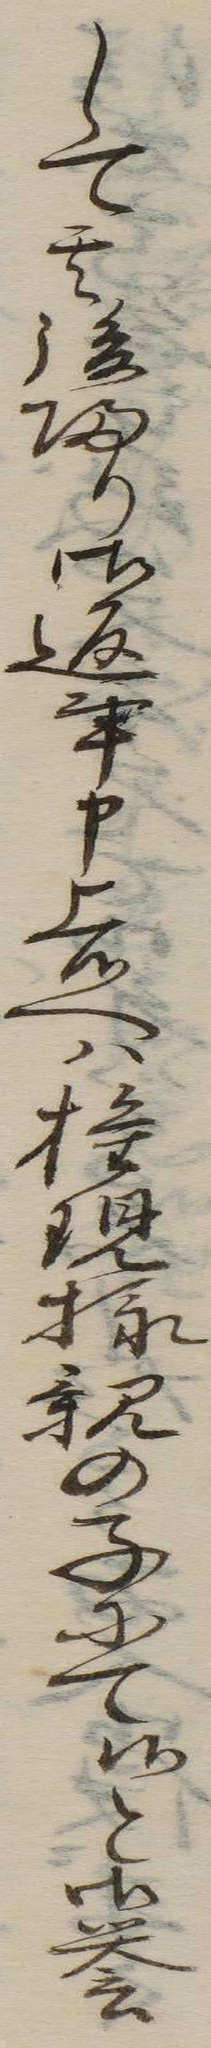して其後帰り御返事申上候へは権現様親の子にて候と御笑言被成候
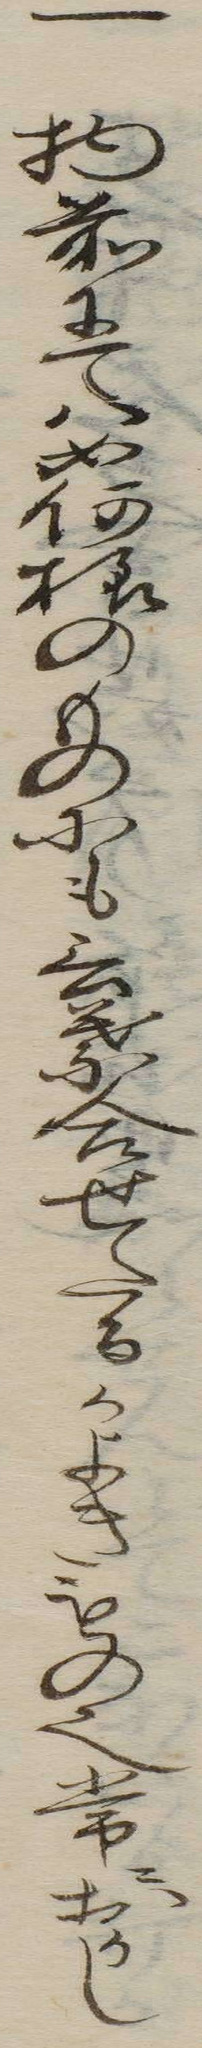一物前にては如何様のものにも言義に合せたるかよきもの也常ニおかし
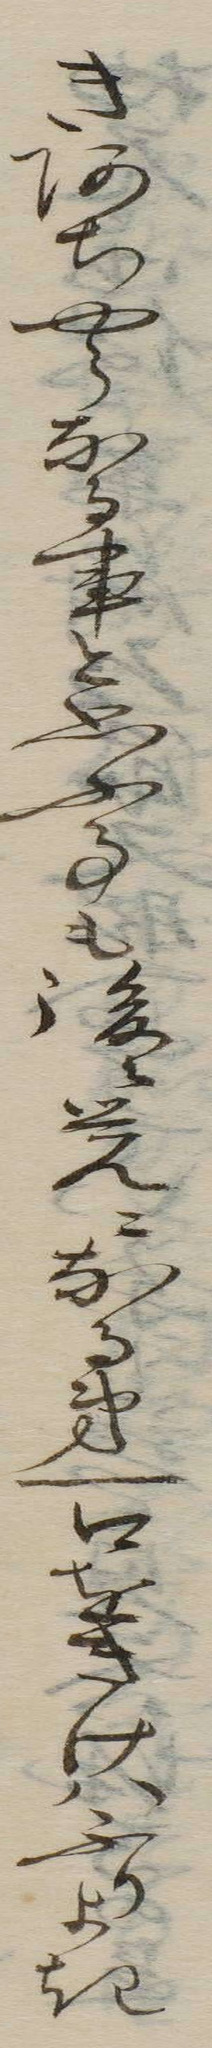きあちやらなる事と思ふ事も後々覚ニなる第一口をきけはふりよき
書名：三河之物語
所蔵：国文学研究資料館
